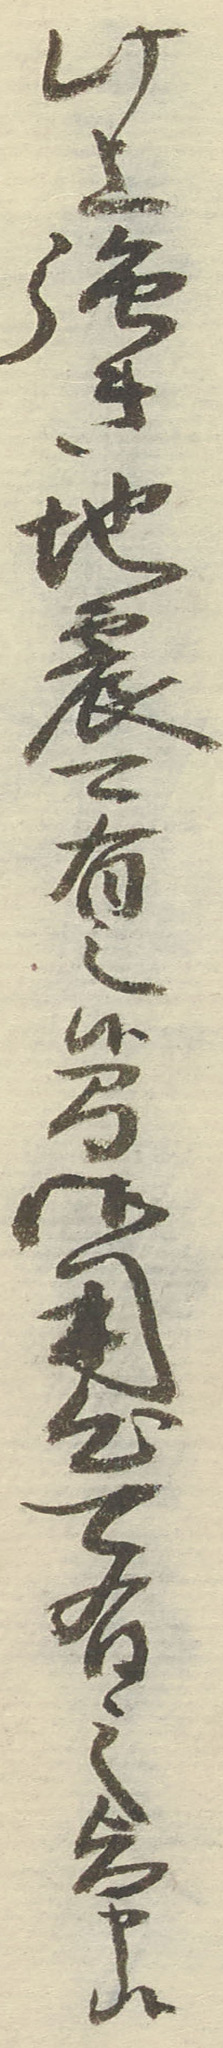此上強き地震可有之候間御用心可有之旨申候
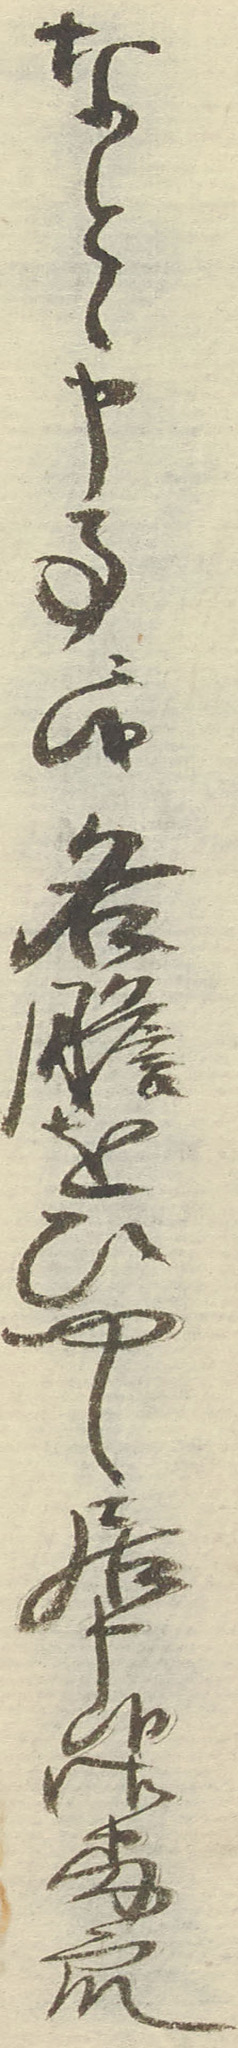なとゝ申事ニ候各膽をひやし居申候御番衆
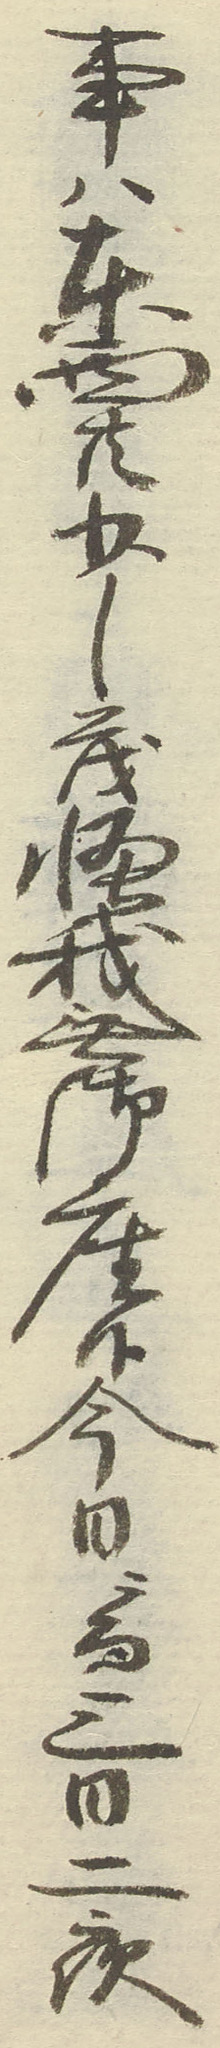事ハ東西共少しも怪我無御座候今日ニ而三日二夜
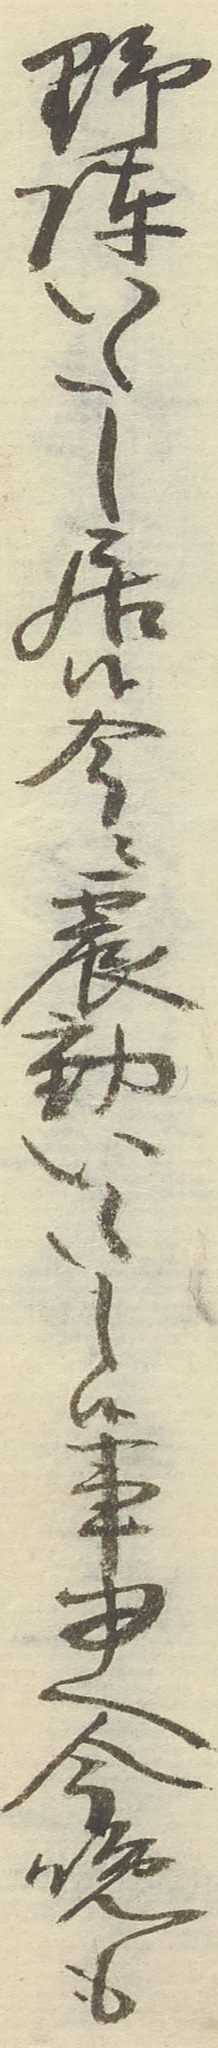野陣いたし居候今ニ震動いたし候事ゆへ今晩も
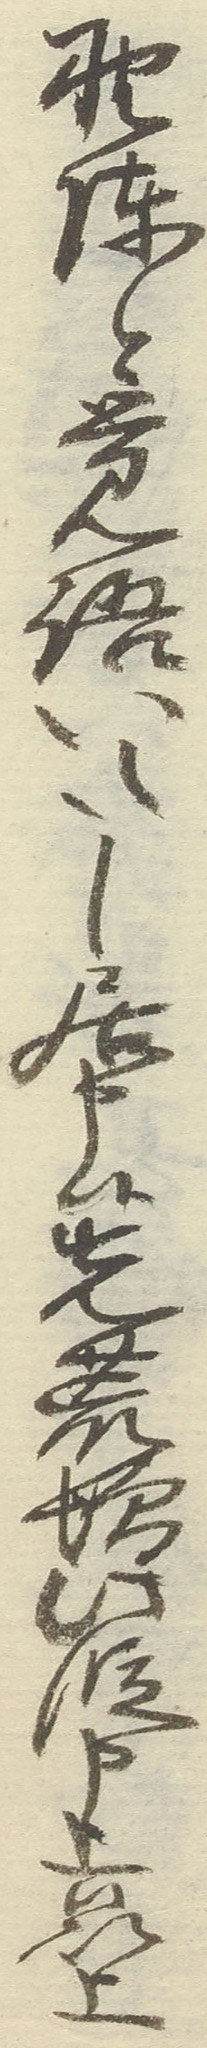野陣と覚悟いたし居申候先荒増此段申上候以上
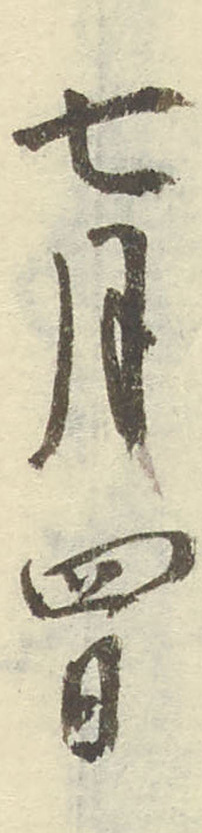七月四日
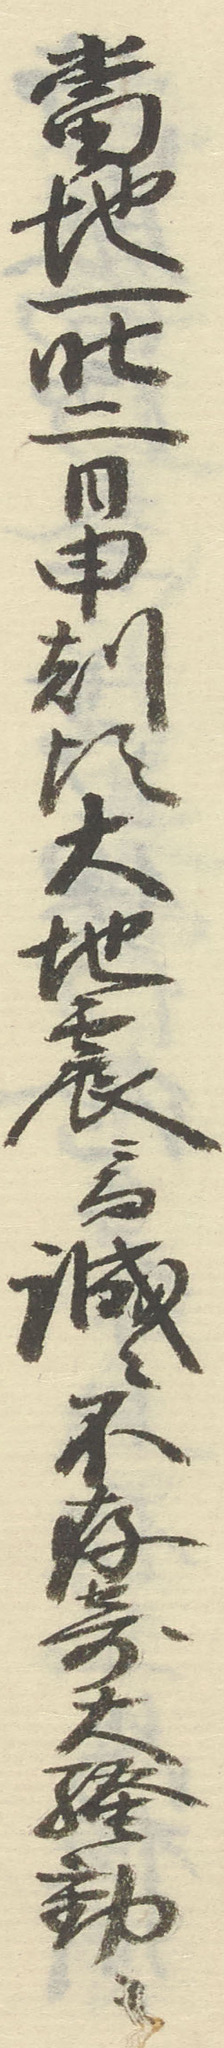當地一昨二日申刻頃大地震ニ而誠ニ不存寄大騒動ニ
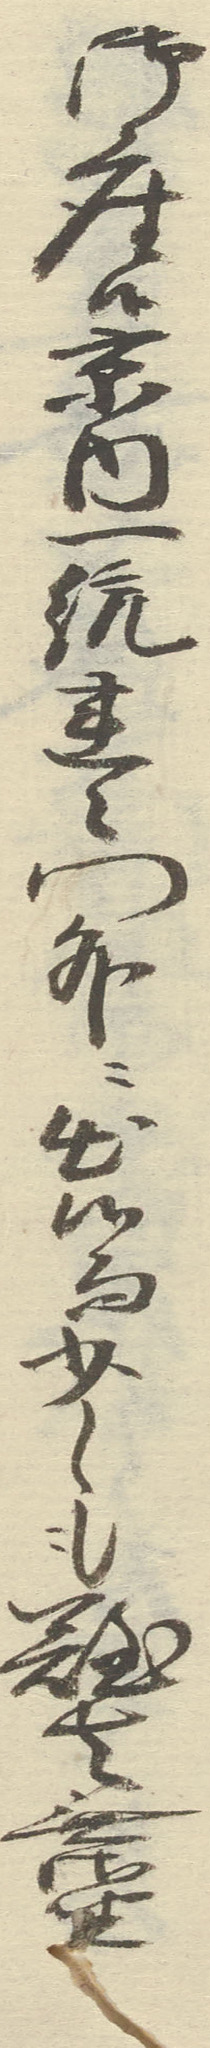御座候京内一統連〻門外ニ出候而少しも難は無御座
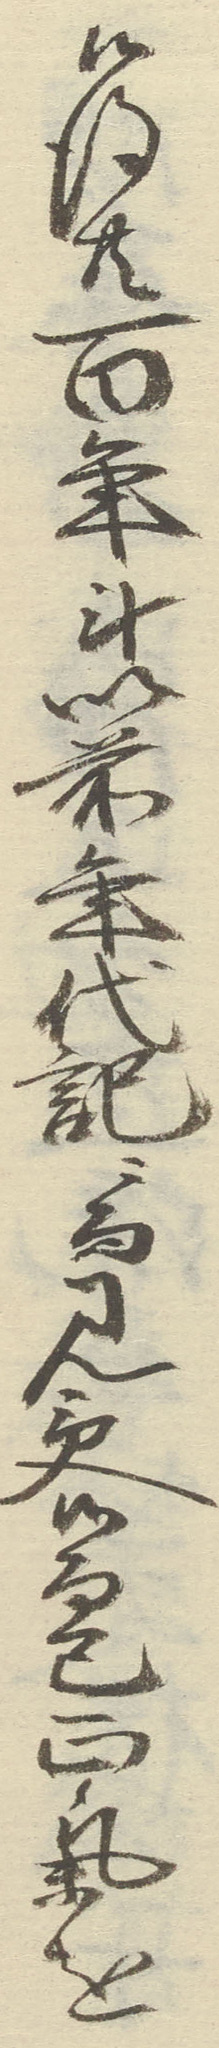候得共百年斗以前年代記ニ而見受候而已正氣を
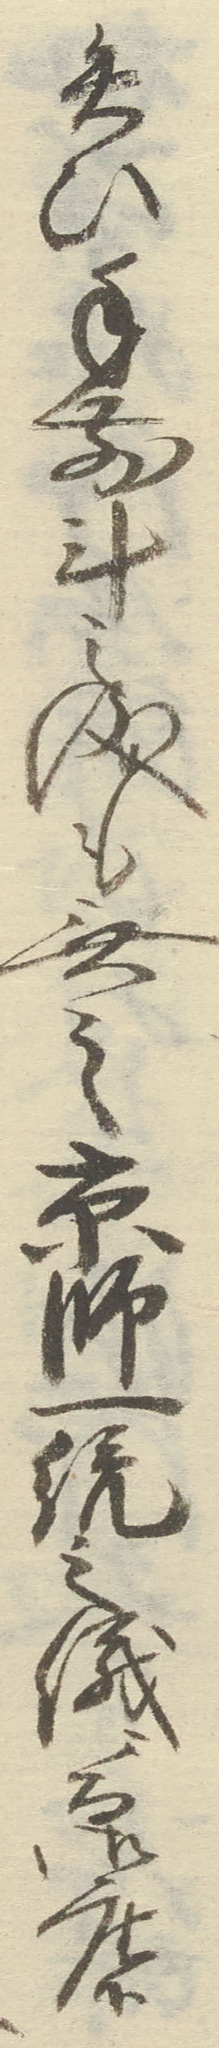失ひ手前斗之儀も無之京師一統之儀ニ而御座候
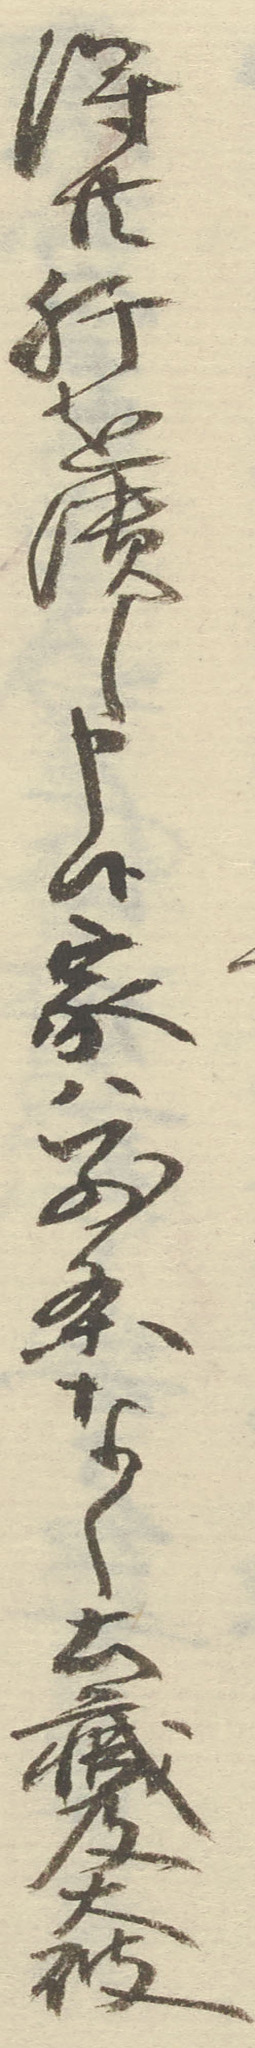得共肝を潰し申候家ハ別条なく土蔵及大被
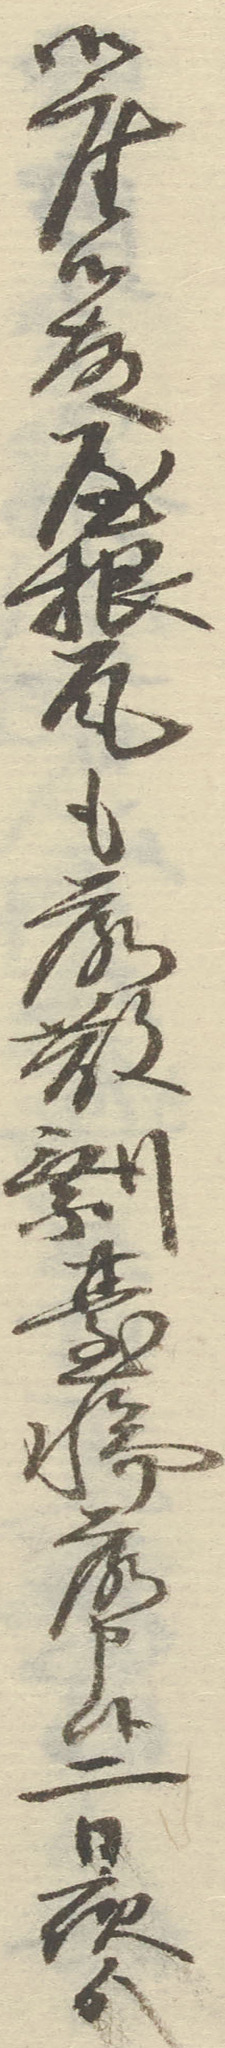御座候故屋根瓦も落散剰臺輪落申候二日夜ゟ
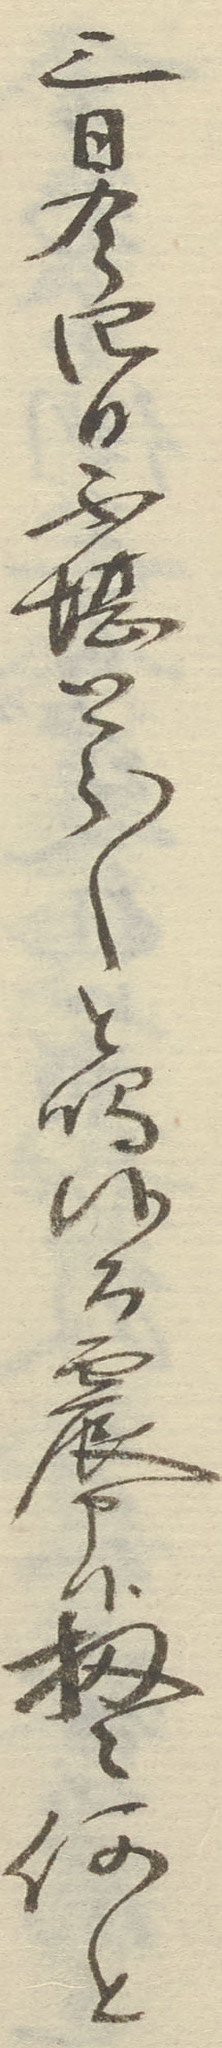三日今四日不堪とう〳〵と鳴候而震申候扨〻何と
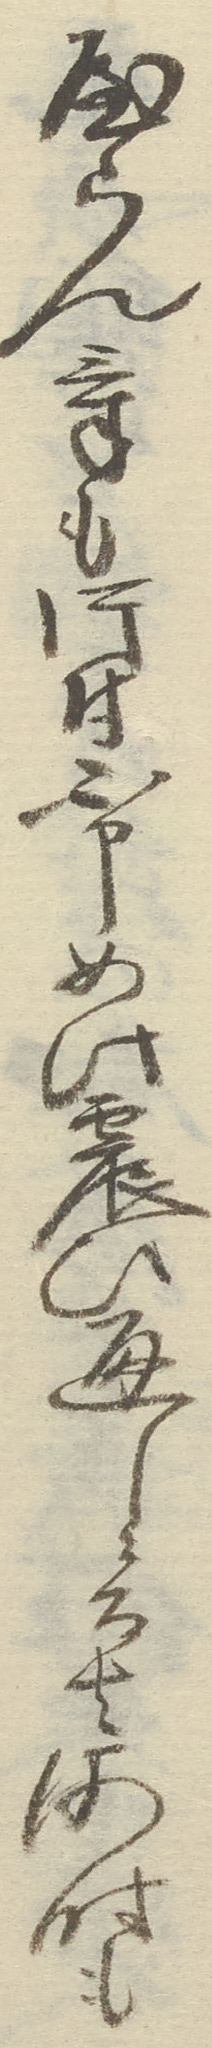やらん氣も片付不申如此震ひ通しニ而は何時も
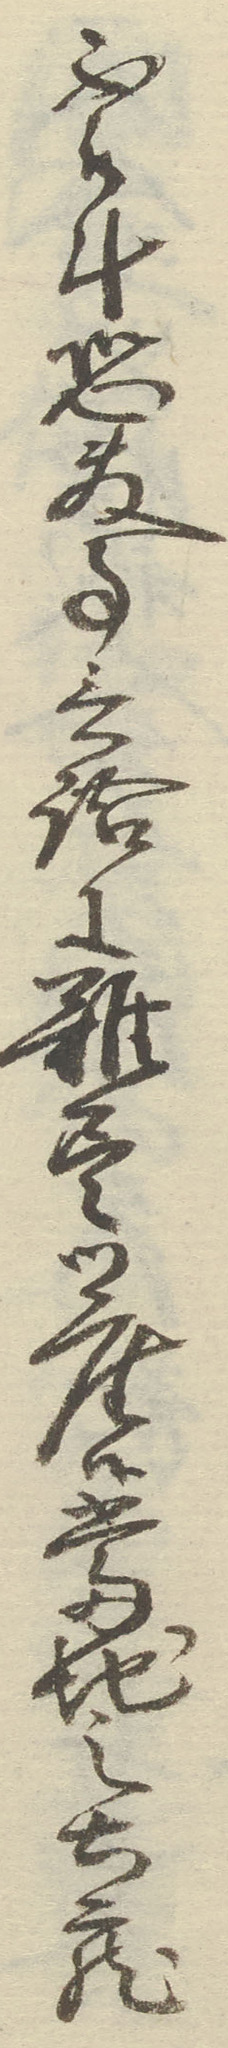不取斗恐敷事言語に難尽御座候當地之土蔵
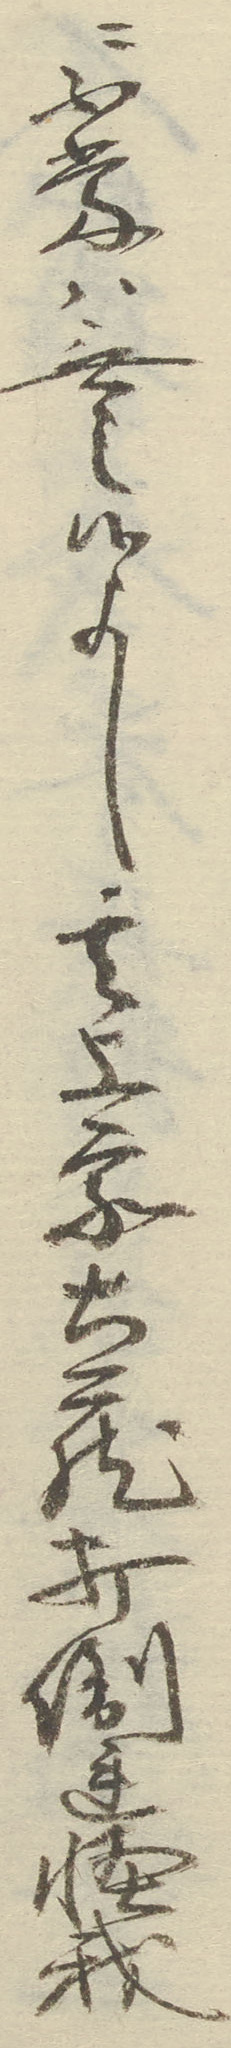ニ不當ハ無之候よし其上我土蔵打倒れ怪我
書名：[七月二日京都大地震に付御番衆大木市左衛門より申し越し候書面畧書状写]
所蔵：東京大学総合図書館 General Library in the University of Tokyo, JAPAN
